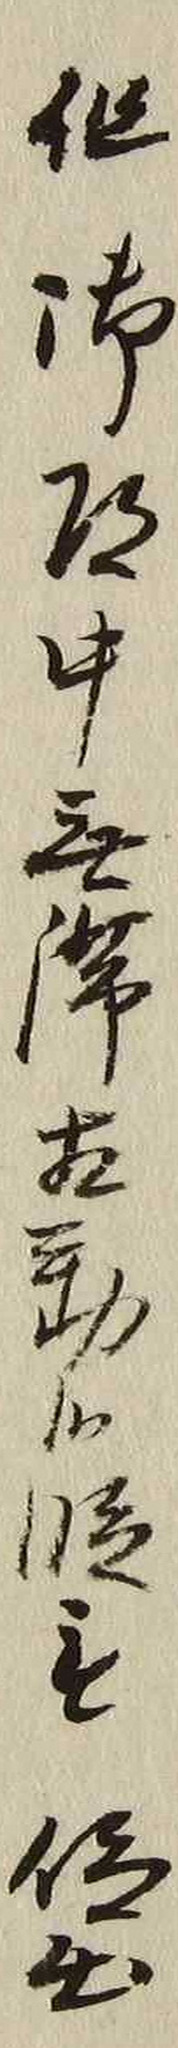但御道中無滞相勤候段被仰出
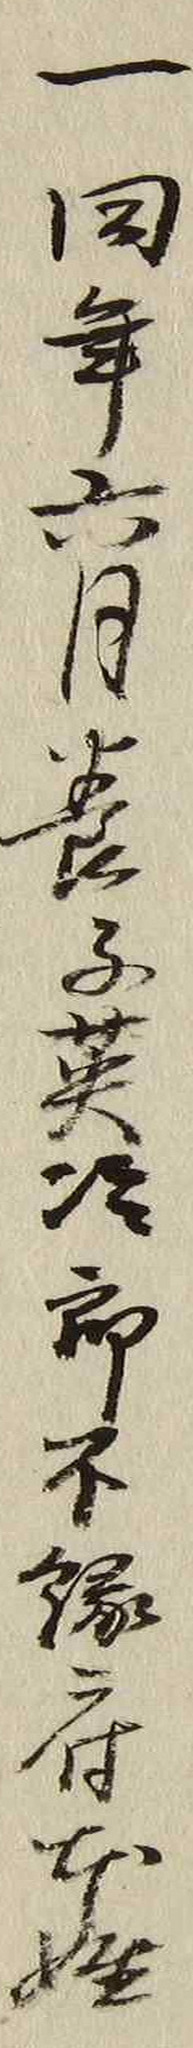一同年六月養子英次郎不縁ニ付本姓
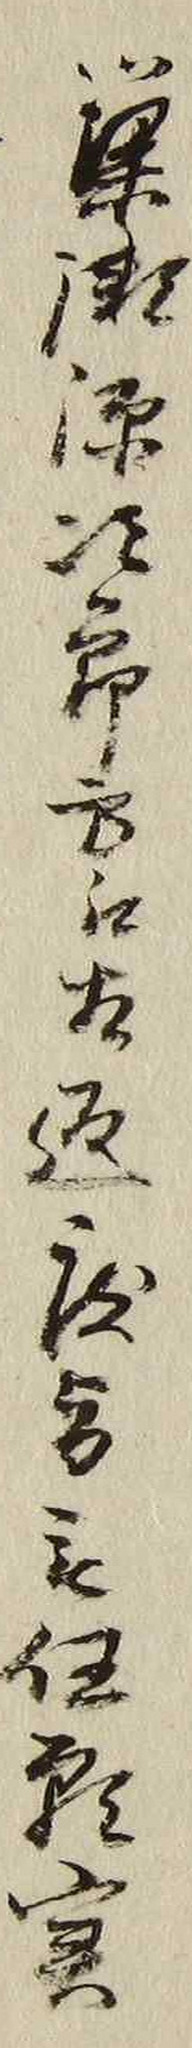簗瀬源次郎方江相返度旨被任願実
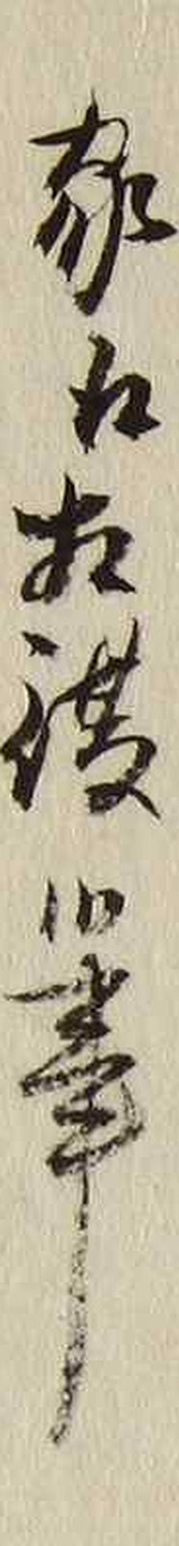家江相復候事
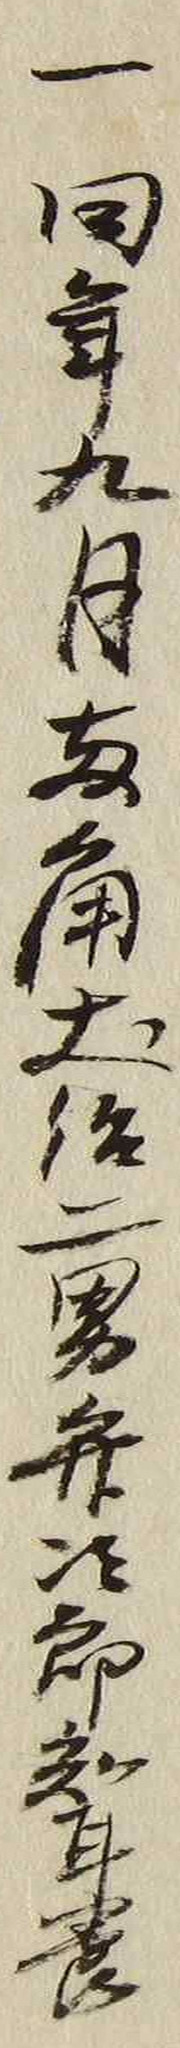一同年九月両角丈治二男弁次郎婿養
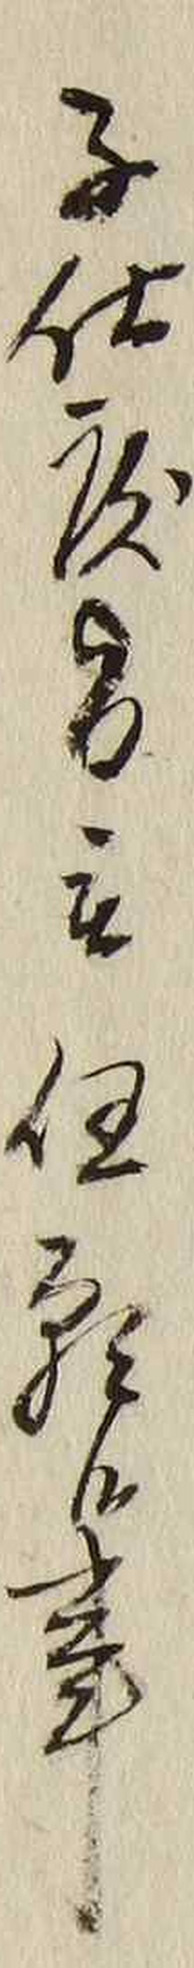子仕度旨被任願候事

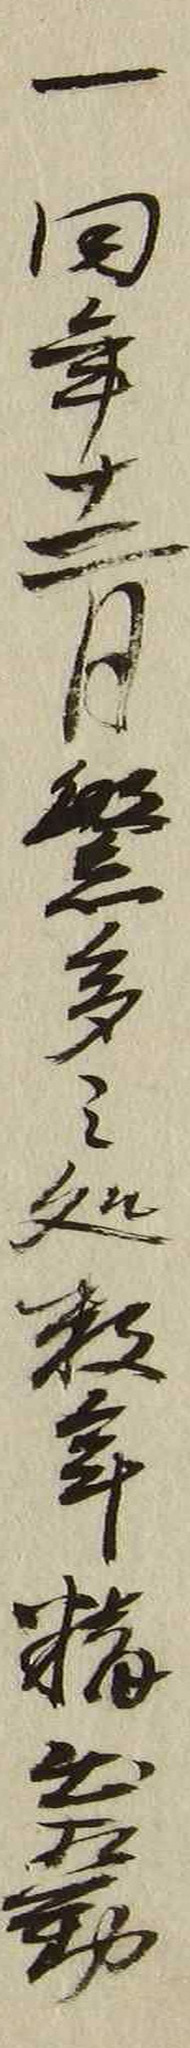一同年十二月繁多之処数年精出相勤
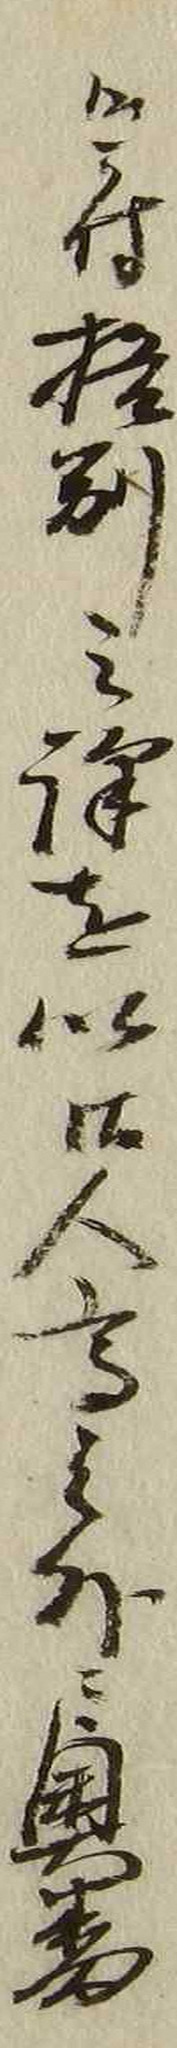候ニ付格別之訳を以御人高之外ニ奥番
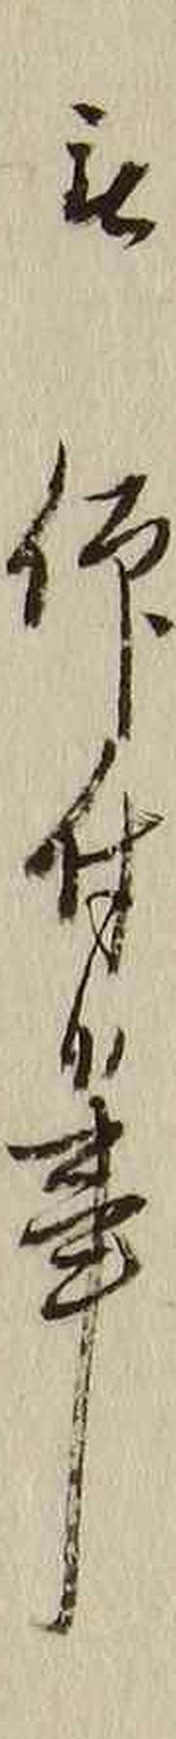被仰付候事
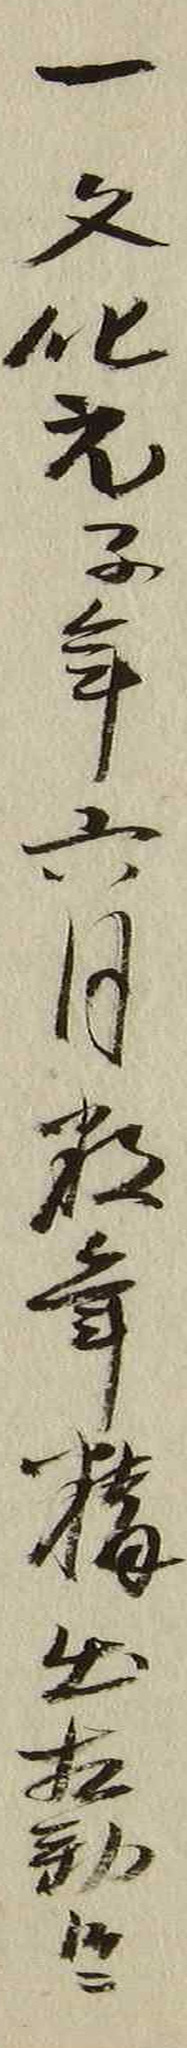一文化元子年六月数年精出相勤候ニ
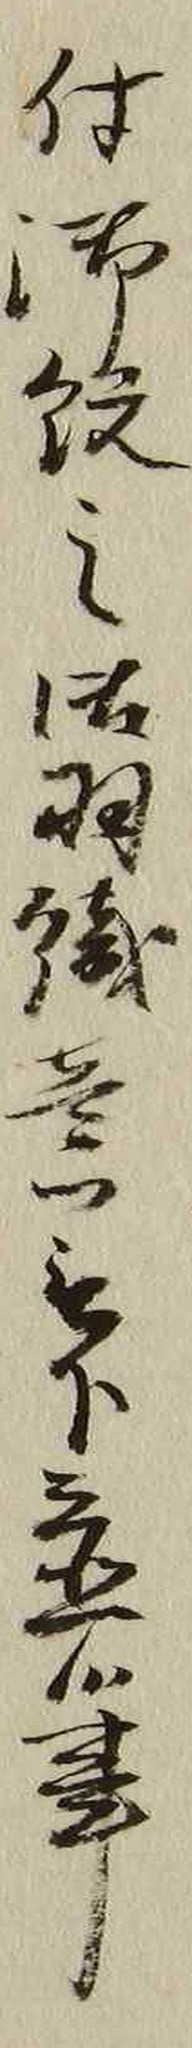付御紋之御羽織壱ツ被下置候事
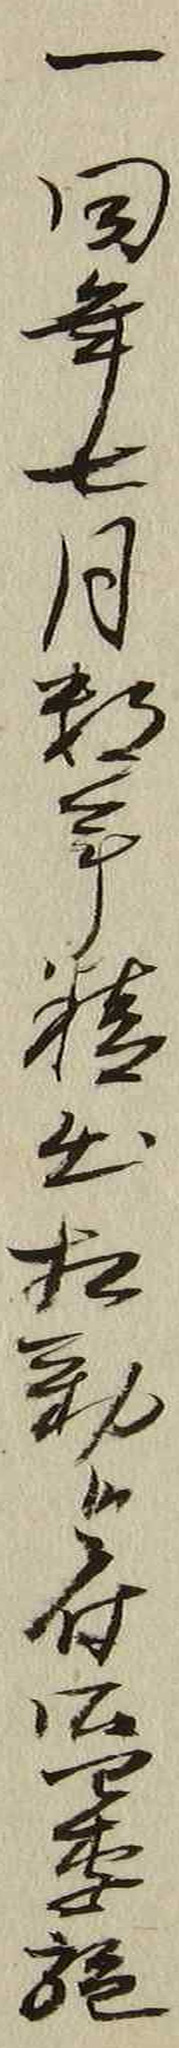一同年七月数年精出相勤候ニ付御四季施
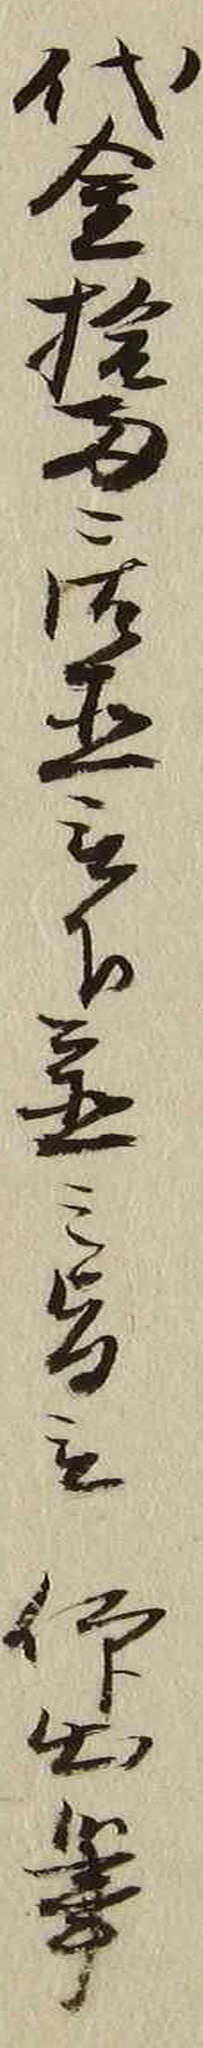代金拾両ニ御直被下置之旨被仰出候事
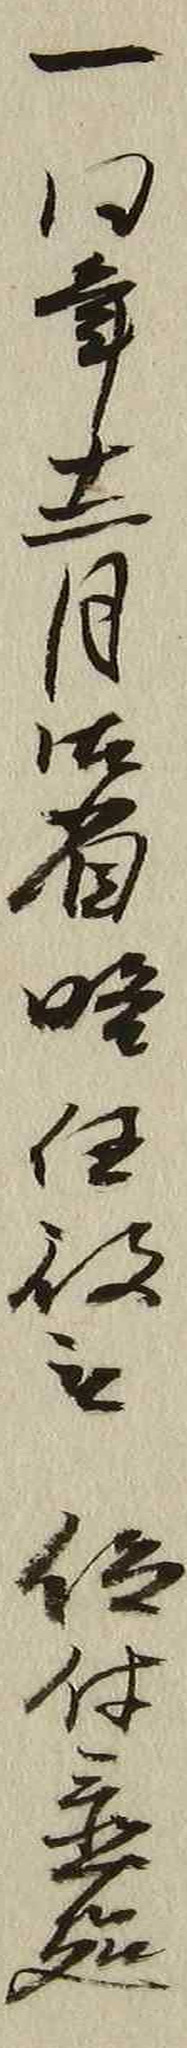一同年十二月御省略任役被仰付置候処
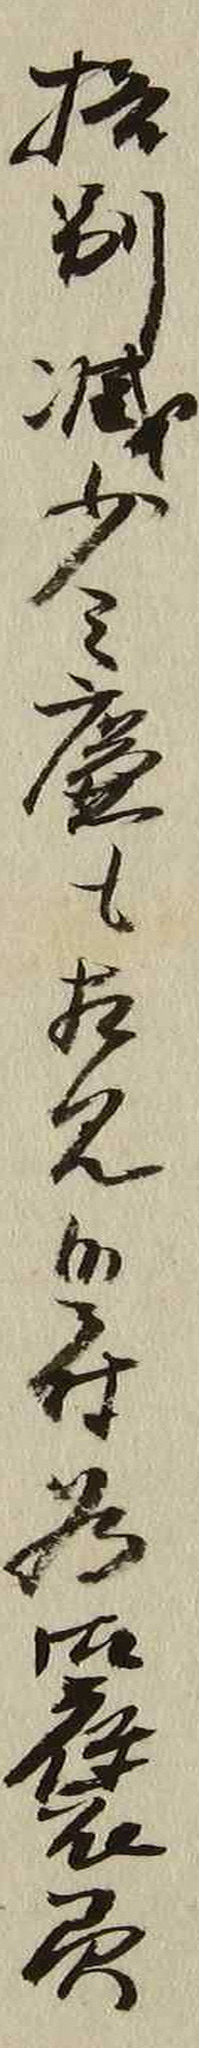格別減少之廉も相見候ニ付為御褒美
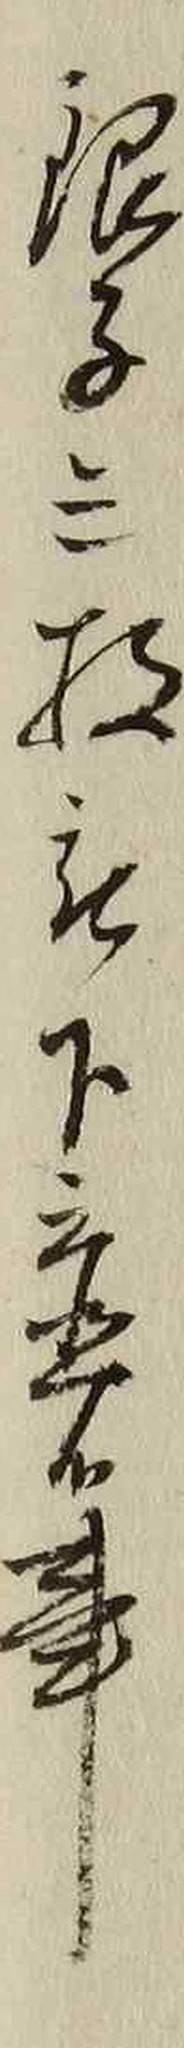銀子三枚被下置候事
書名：諸士系譜　巻之345　も之部1
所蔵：会津若松市立会津図書館
